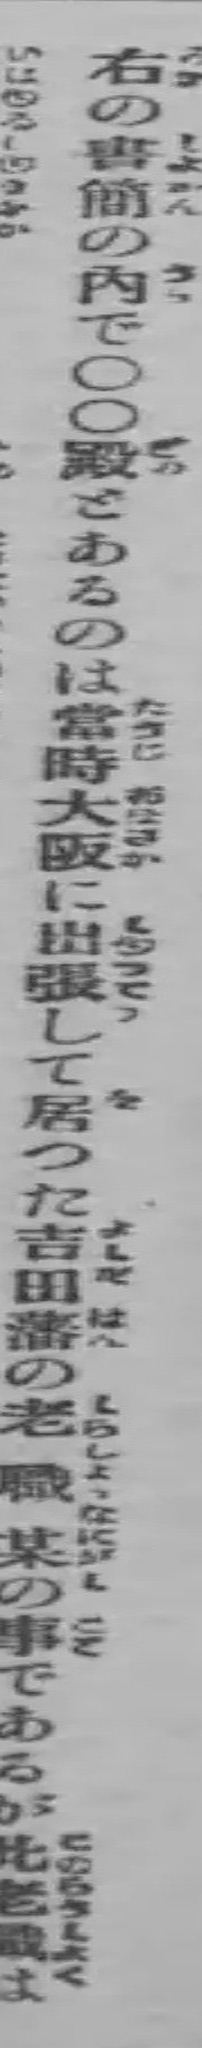右の書簡の内で○○殿とあるのは当時大阪に出張して居つた吉田藩の老職某の事であるが此老職は
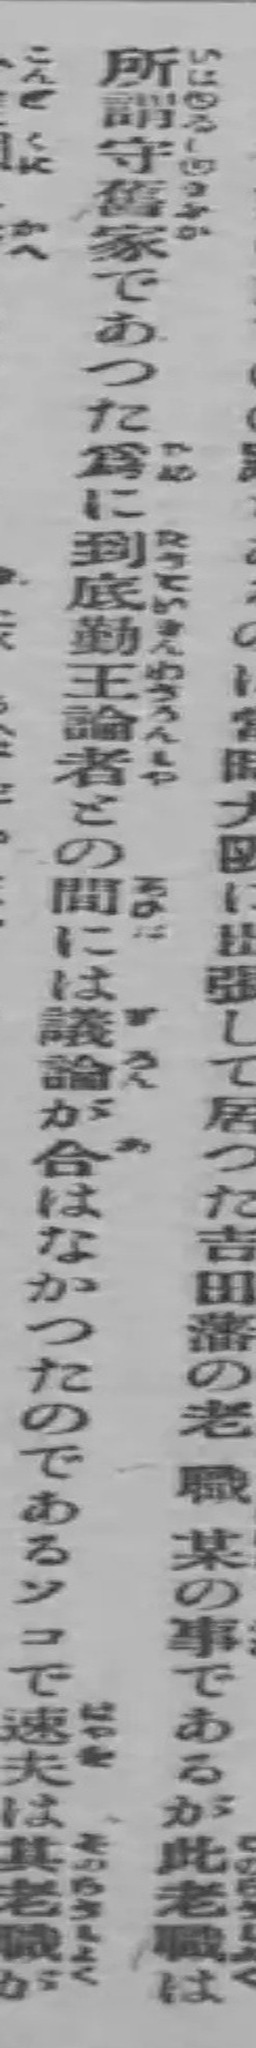所謂守旧家であつた為に到底勤王論者との間には議論が合はなかつたのであるソコで速夫は其老職が
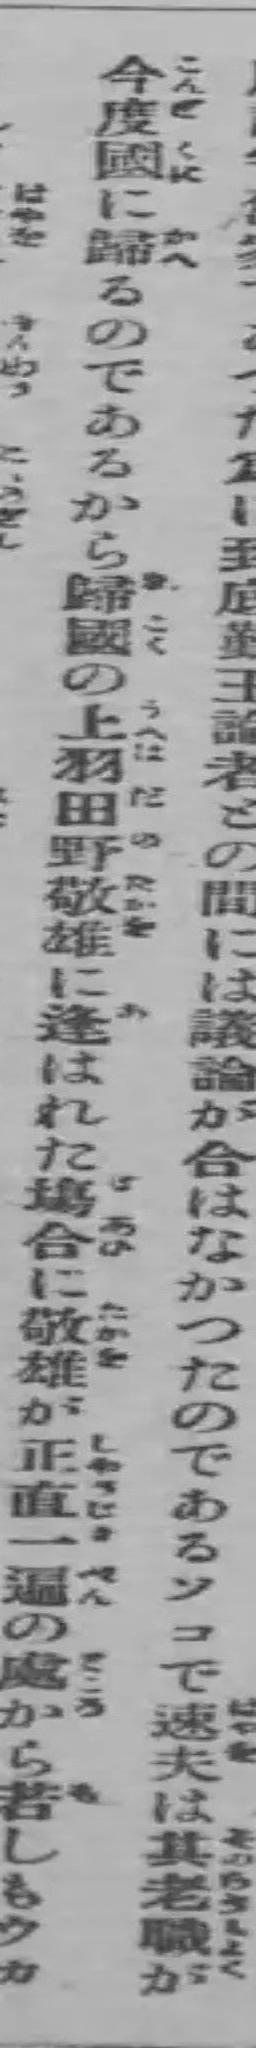今度国に帰るのであるから帰国の上羽田野敬雄に逢はれた場合に敬雄が正直一遍の処から若しもウカ
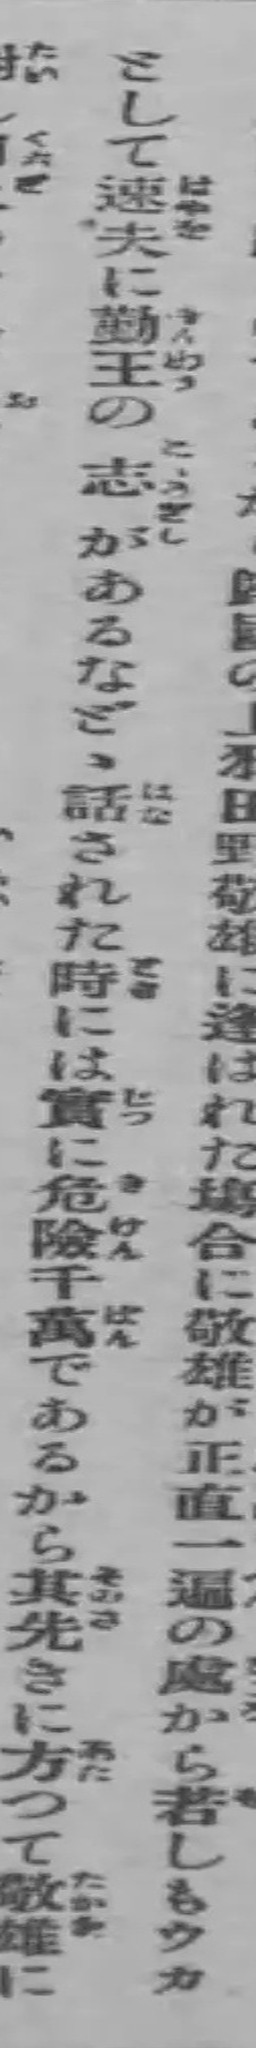として速夫に勤王の志があるなどゝ話された時には実に危険千万であるから其先きに方つて敬雄に
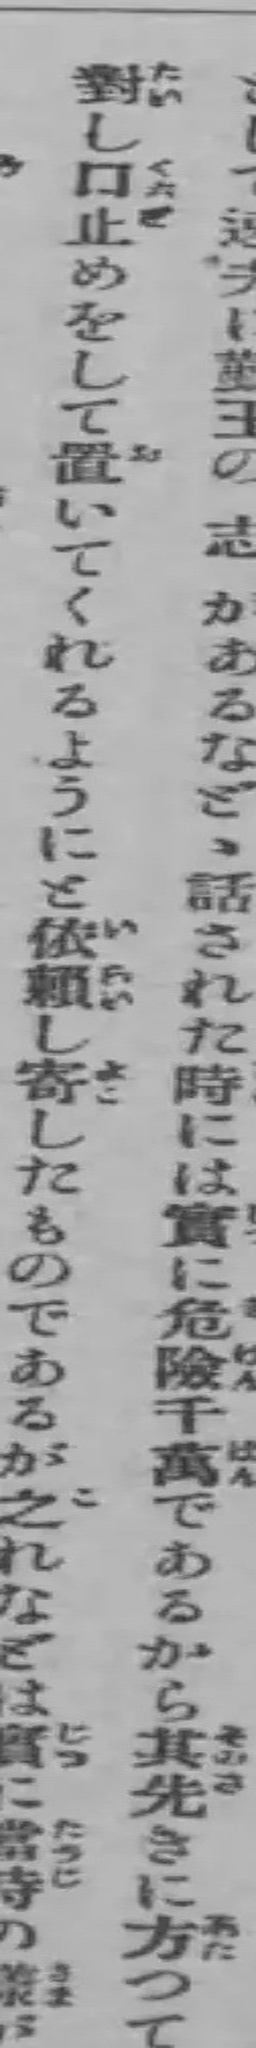対し口止めをして置いてくれるようにと依頼し寄したものであるが之れなどは実に当時の様が目のあ
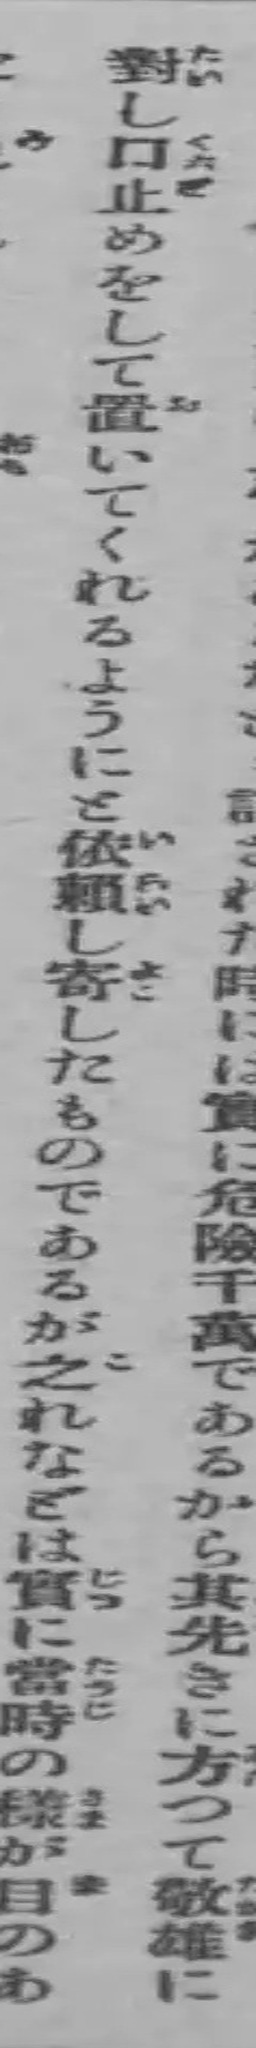対し口止めをして置いてくれるようにと依頼し寄したものであるが之れなどは実に当時の様が目のあ
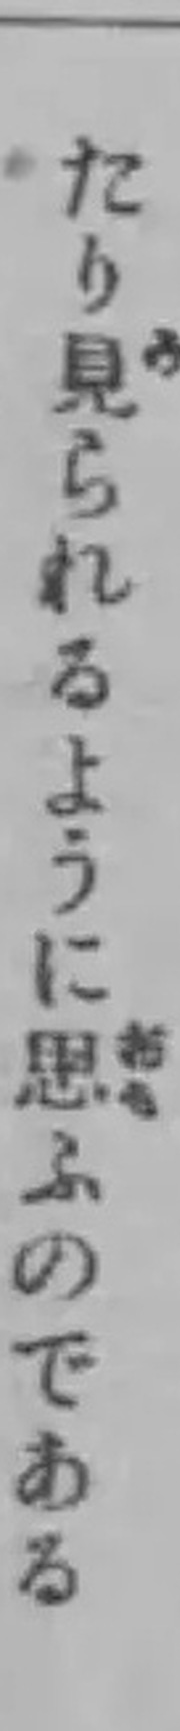たり見られるように思ふのである
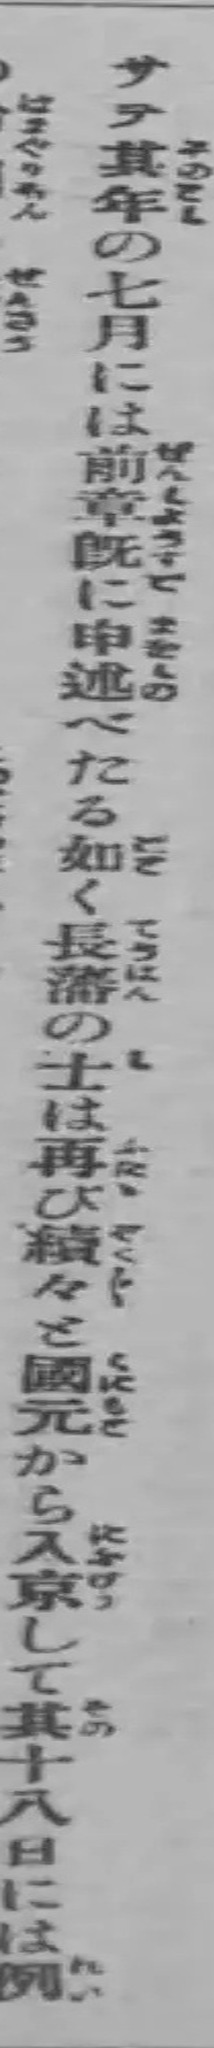サテ其年の七月には前章既に申述べたる如く長藩の士は再び続々と国元から入京して其十八日には例
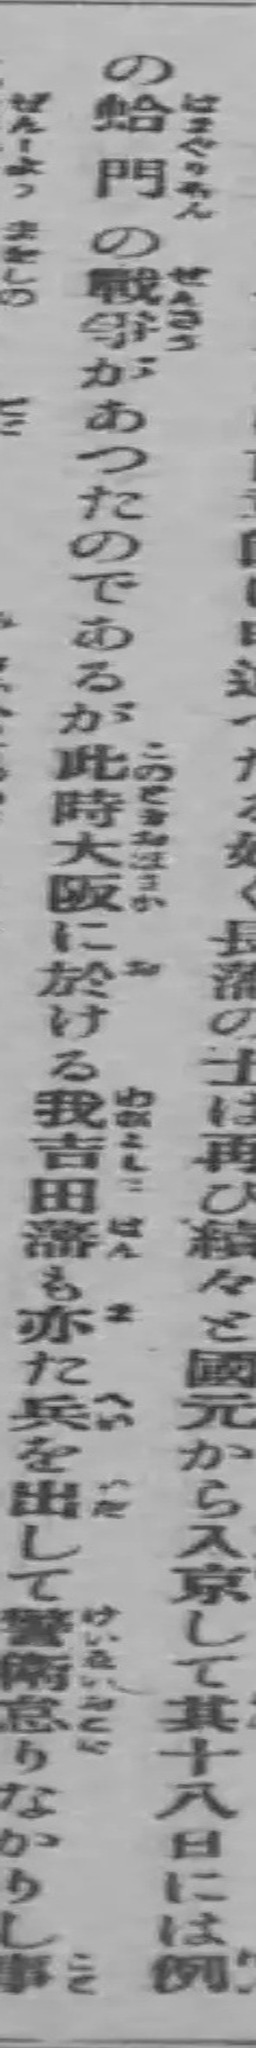の蛤門の戦争があつたのであるが此時大阪に於ける我吉田藩も亦た兵を出して警衛怠りなかりし事
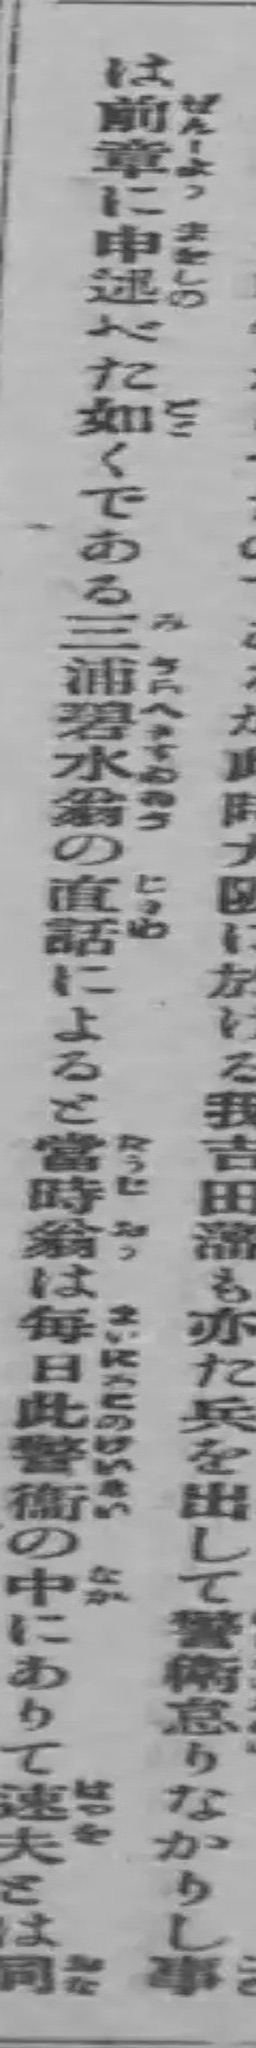は前章に申述べた如くである三浦碧水翁の直話によると当時翁は毎日此警衛の中にありて速夫とは同
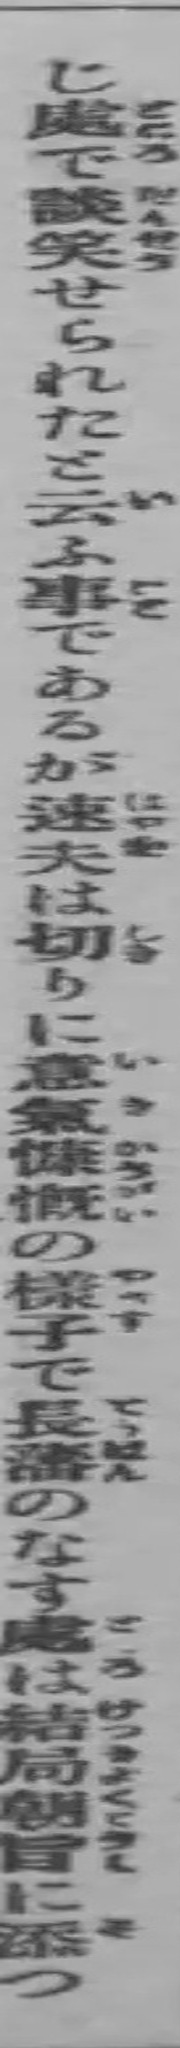じ処で談笑せられたと云ふ事であるが速夫は切りに意気慷慨の様子で長藩のなす処は結局朝旨に添つ
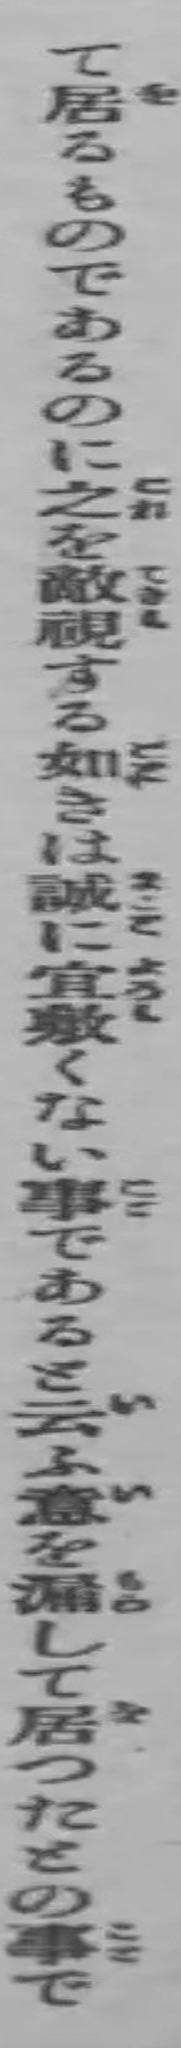て居るものであるのに之を敵視する如きは誠に宜敷くない事であると云ふ意を漏して居つたとの事で
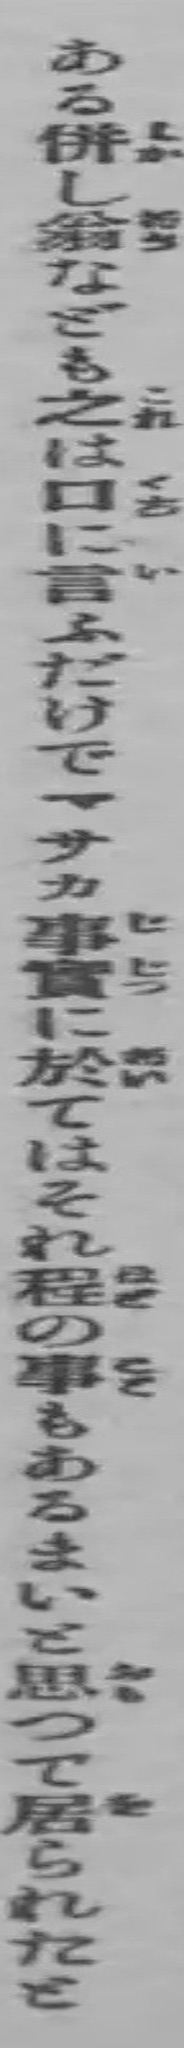ある併し翁なども之は口に言ふだけでマサカ事実に於てはそれ程の事もあるまいと思つて居られたと
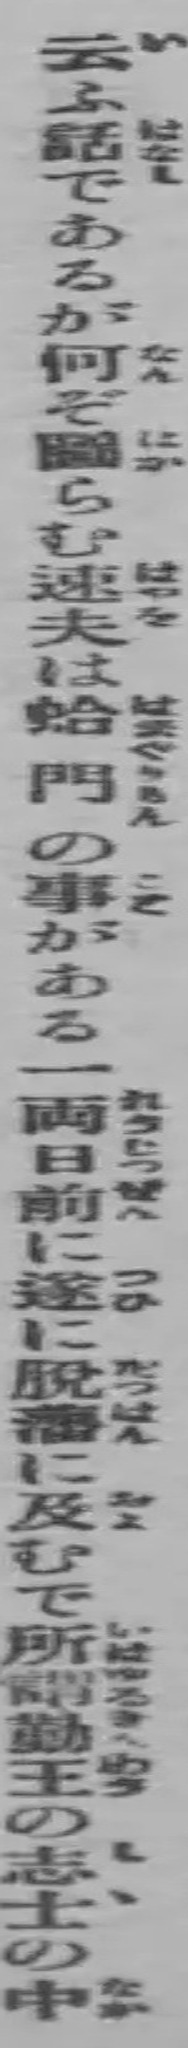速夫の脱藩云ふ話であるが何ぞ図らむ速夫は蛤門の事がある一両日前に遂に脱藩に及むで所謂勤王の志士の中
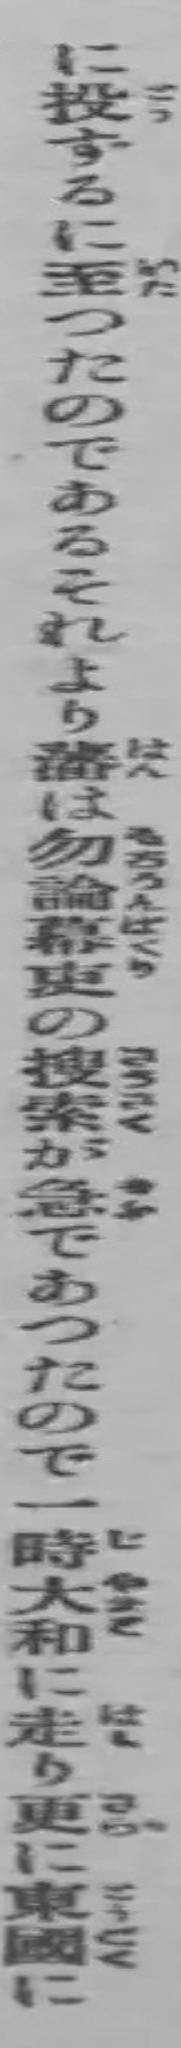に投ずるに至つたのであるそれより藩は勿論幕吏の捜索が急であつたので一時大和に走り更に東国に
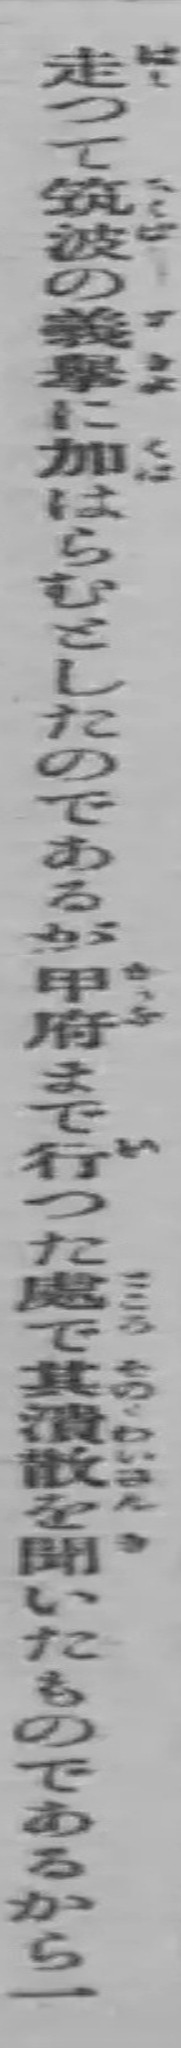走つて筑波の義挙に加はらむとしたのであるが甲府まで行つた処で其潰散を聞いたものであるから一
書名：豊橋市史談
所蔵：国立国会図書館 National Diet Library, JAPAN
